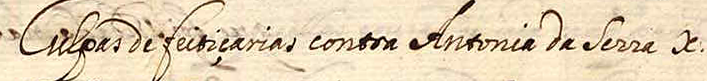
Culpas de feitiçarias contra Antonia da Serra x.
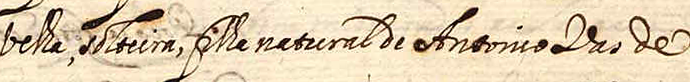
Velha, solteira, filha natural de Antonio Vas de
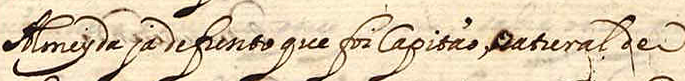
Almeyda já defunto que foi Capitão, natural de
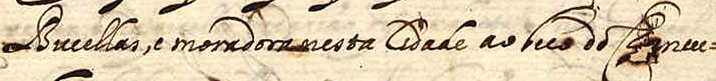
Bucellas, e moradora nesta Cidade ao beco do Chancu
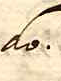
do.
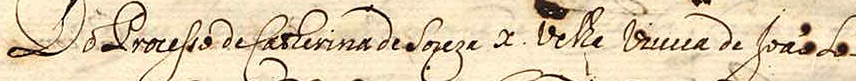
Do Processo de Catherina de Souza x .Velha viuua de João Lo
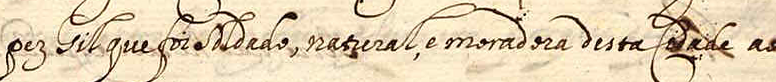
qez Gil que foi soldado, natural, e moradora desta Cidade ao
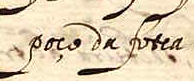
poço da fosea.
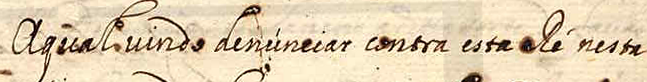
A qual uindo denúnciar contra esta Ré nesta
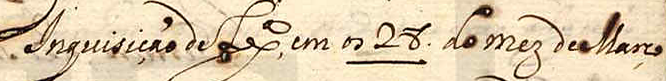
Inquisição de Lx.a em os 28 do mez de Março
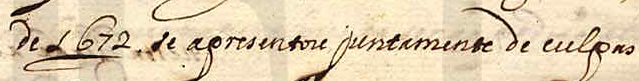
de 1672 se apresentou juntamente de culpas
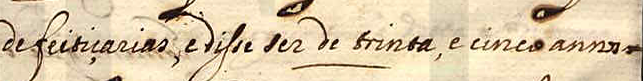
de feitiçarias, e disse ser de trinta, e cinco annos
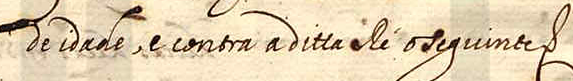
de idade, e contra a ditta Ré o seguinte &
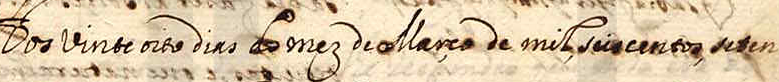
Aos vinte oito dias do mez de Março de mil, seiscentos, seten
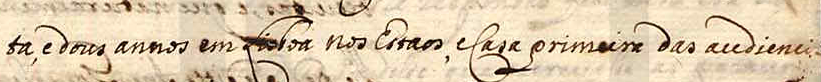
ta, e dous annos em Lisboa nos Estaos, e Casa primeira das audienci
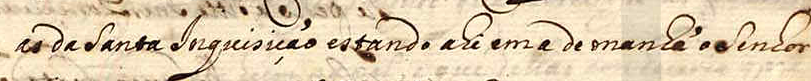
as da Santa Inquisição estando ahi em a da manhã o Senhor
